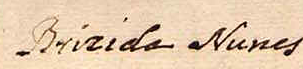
Brizida Nunes
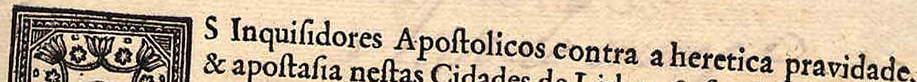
OS Inquisidores Apostolicos contra a heretica pravidade,
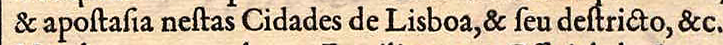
& apostasia nestas Cidades de Lisboa, & seu destricto, &c.
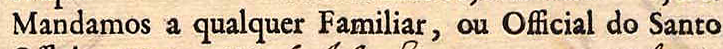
Mandamos a qualquer Familiar, ou Official do Santo
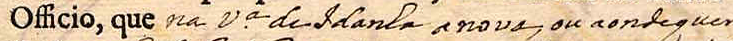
Officio, que na V.a de Idanha a nova, ou aonde quer
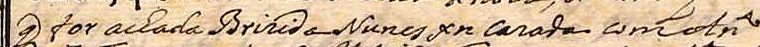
q̄ for achada Brizida Nunes xn cazada com Anto
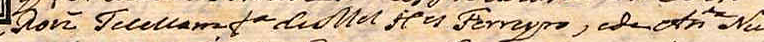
Roiz̄ Tecellam, fa de M.el Hes Ferreyro, e de Anta Nu
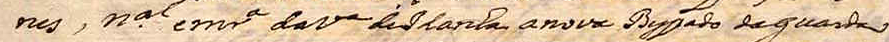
nes, n.al e mra da Va de Idanha a nova Bispado da guarda
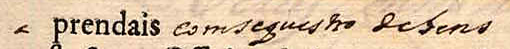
a prendais com sequestro de bens
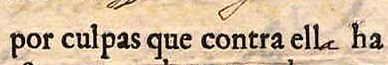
por culpas que contra ella ha
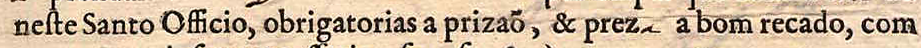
neste Santo Officio, obrigatorias a prizaõ, & preza a bom recado, com
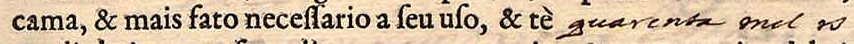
cama, & mais fato necessario a seu uso, & tè quarenta mil rs
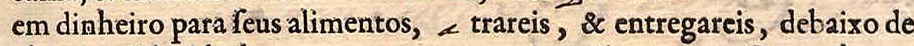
em dinheiro para seus alimentos, a trareis, & entregareis, debaixo de
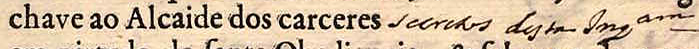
chave ao Alcaide dos carceres secretos desta Inqam
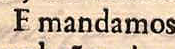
E mandamos
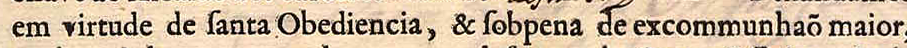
em virtude de santa Obediencia, & sob pena de excommunhaõ maior,
